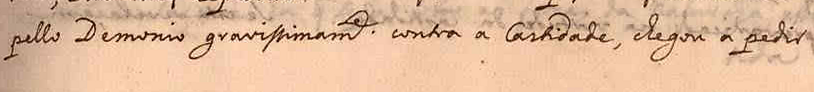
pello Demonio gravissimam.te contra a Castidade, chegou a pedir
